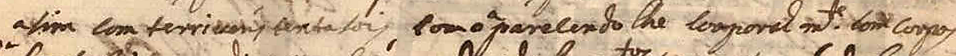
asim com terriuens tentasois, como aparecendo lhe corporalm.te com corpos
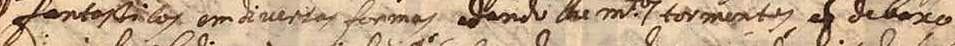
fantasticos em diuersas formas, e dando lhe m.tos tormentos, e q̄ debaxo
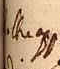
lhe app
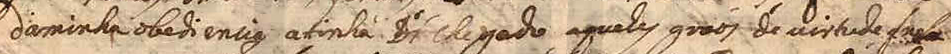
da minha obediencia a tinha Ds̄ chegado aqueles graos de uirtude q̄ nela
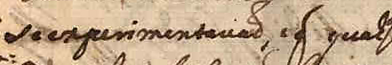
se experimentauaõ, e q̄ qual
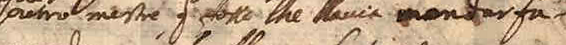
outro mestre q̄ fosse lhe hauia mandar fa
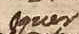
quer
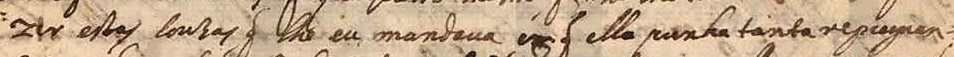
zer estas couzas q̄ lhe eu mandaua, em q̄ ella punha tanta repugnan
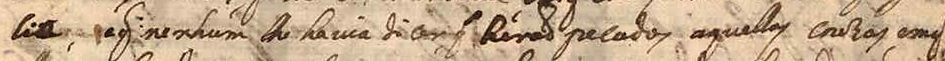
cia, e q̄ nenhum lhe hauia dicer q̄ heraõ pecados aquellas couzas em q̄
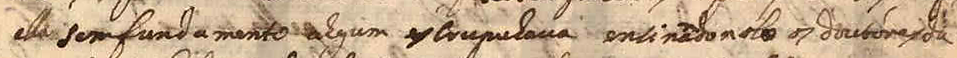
ella sem fundamento algum escrupulaua ensinadonolo os doutores da
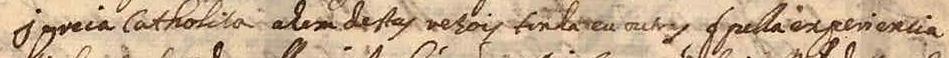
jgreia Catholica, alem destas rezois tinha ou outras q̄ pella experiencia
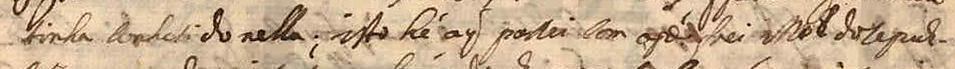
tinha conhesido nella; isto hé o q̄ passei com o p.e frei Mel do sepul
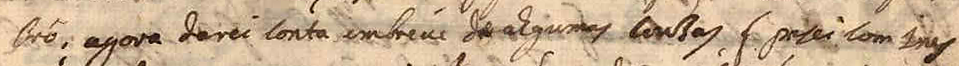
Cro, agora darei conta em breue de algumas couzas, q̄ pasei com Jnes
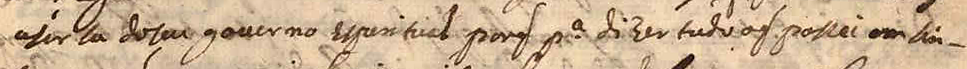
aserca do seu gouerno Esperitual porq̄ p.a dizer tudo o q̄ passei em sin
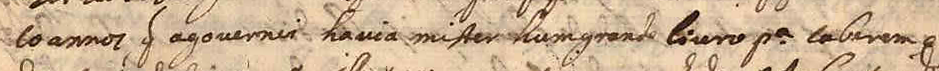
co annos q̄ a gouernei hauia mister hum grande liuro p.a caberem, e
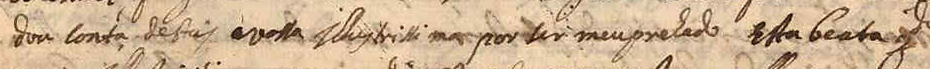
dou conta destas a vossa Illustrissima por ser meu prelado Esta beata q̄do
